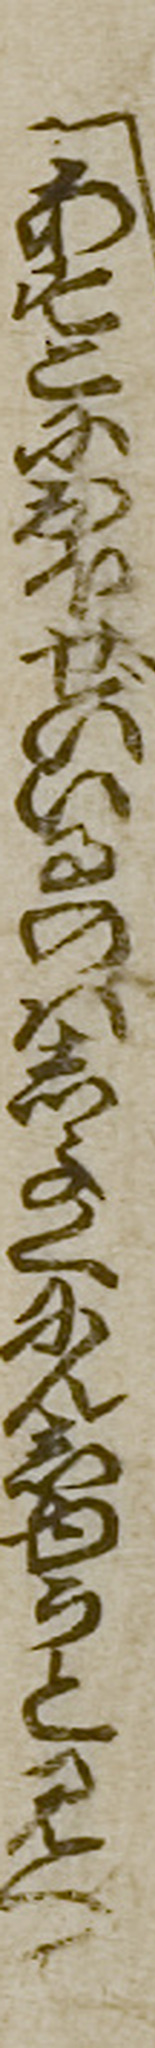〽あそこにおほぜいいるのはしよくにんしゆうと見へて
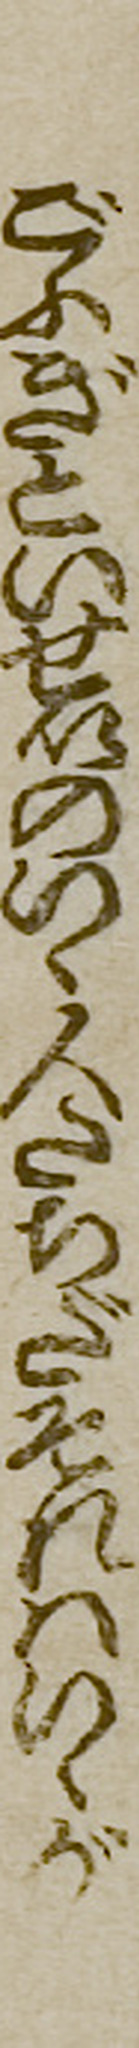ごふぎといせいのいゝ人たちだそれはいゝが
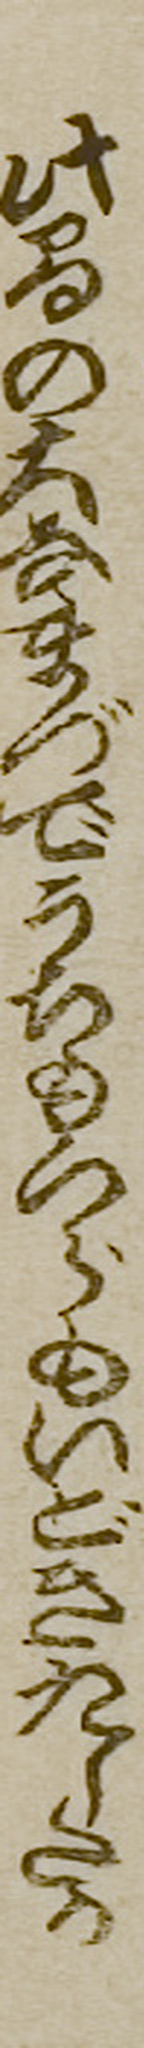此間の大なまづでうちもくらもいごきたしたか
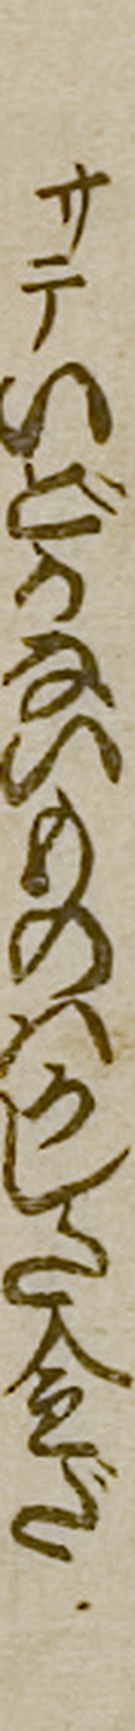サテいごかないものはかした金だ
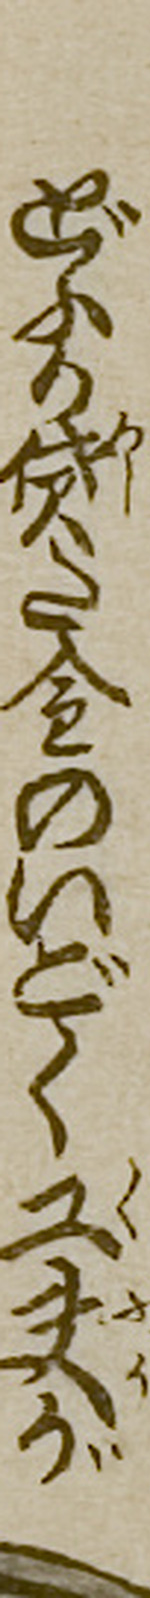どふか貸た金のいごく工夫が
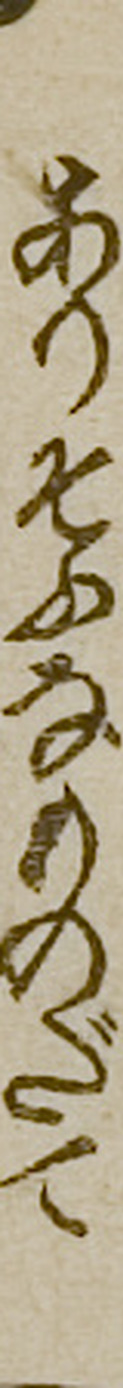ありそふなものだて
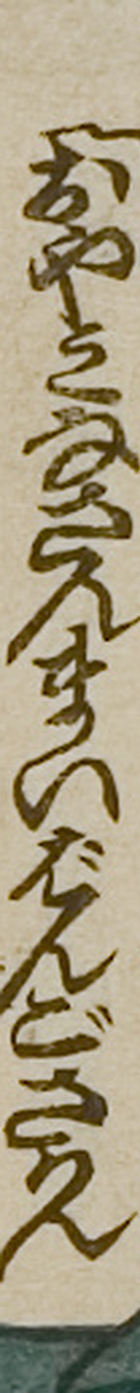〽おやみなさんまいばんごさかん
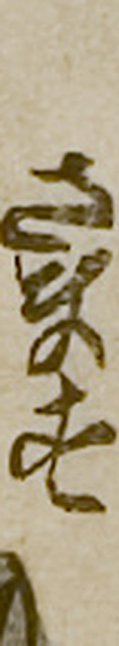さます
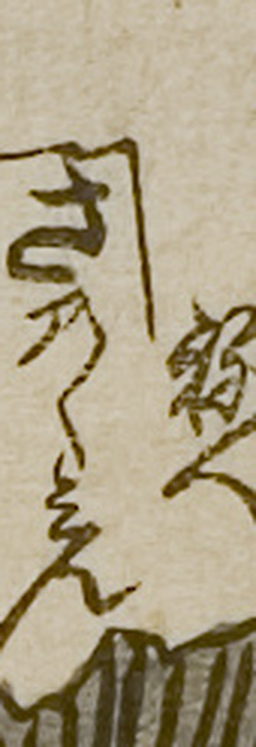〽さア＼みん
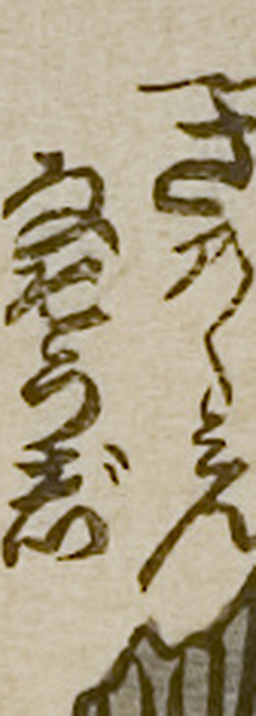なそうじ
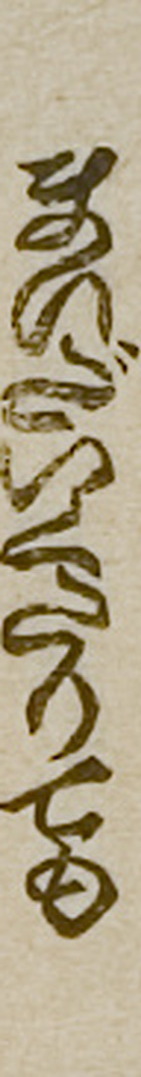まいだいくたりても
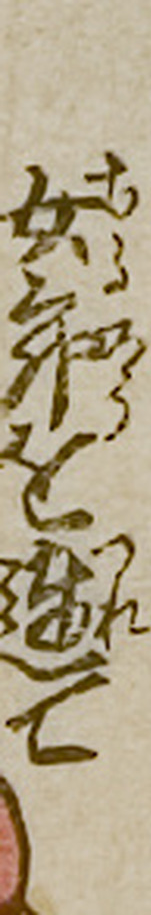女郎を連て
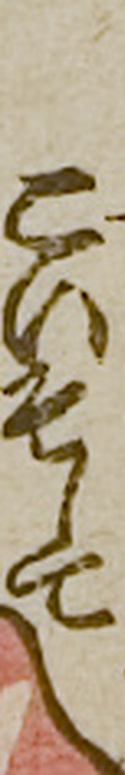こいそして
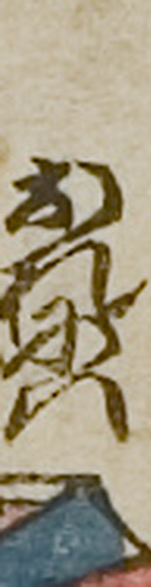おれには
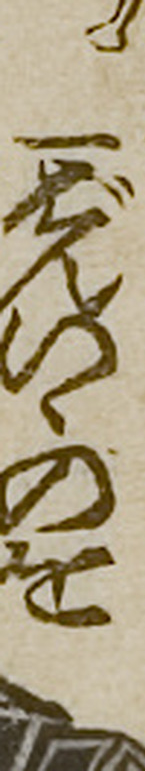一ばんいゝのを
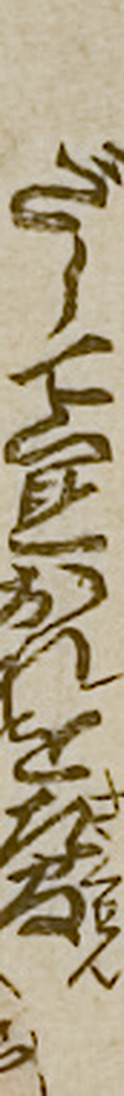だしてくれおれを左官
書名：瓢箪
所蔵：東京大学総合図書館 General Library in the University of Tokyo, JAPAN
